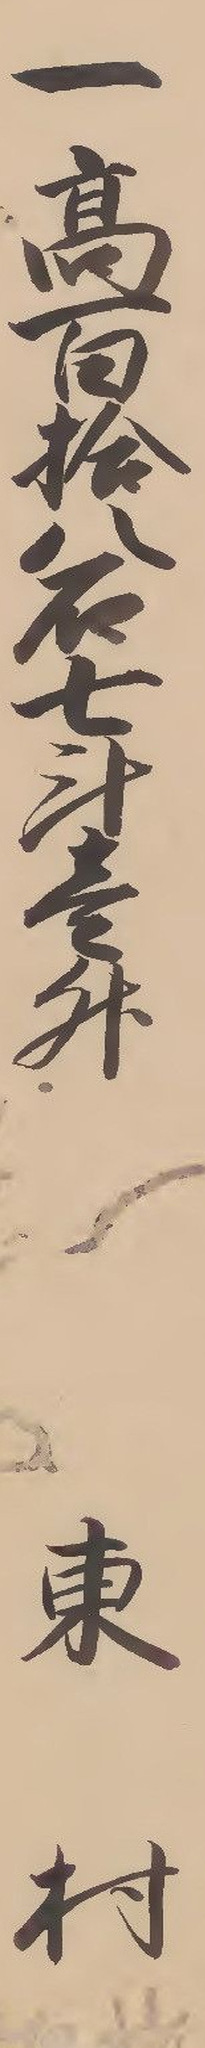一高百拾八石七斗壱升東村

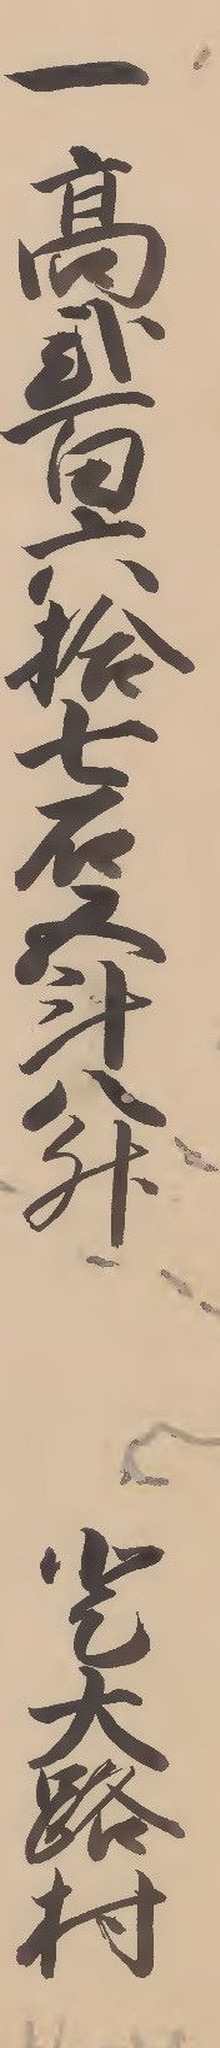一高弐百六拾七石五斗八升登大路村
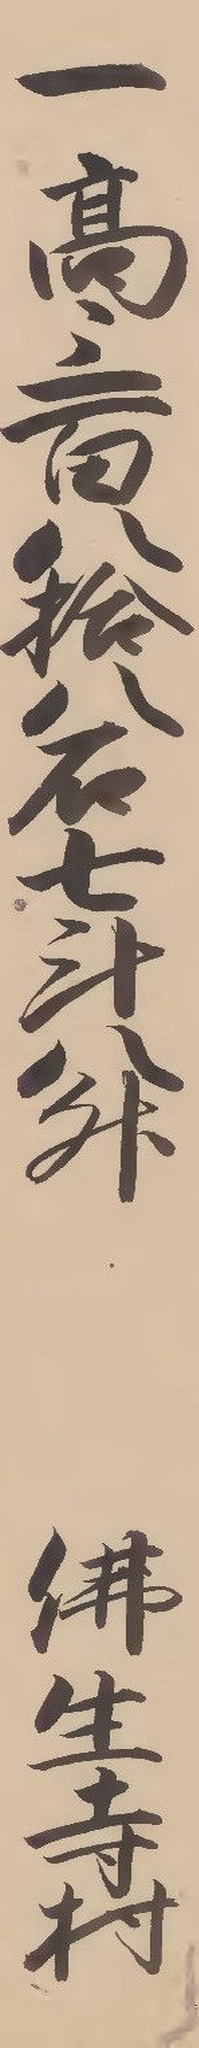一高三百八拾八石七斗八升仏生寺村
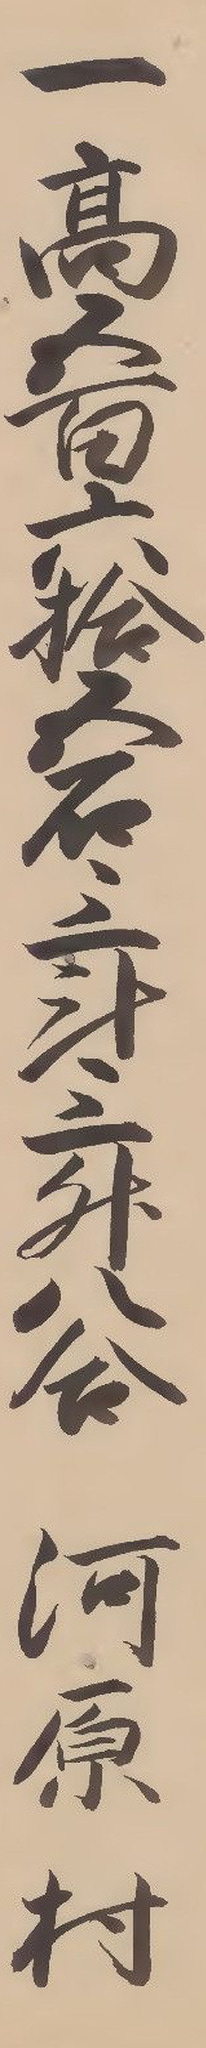一高五百六拾五石三斗三升八合河原村
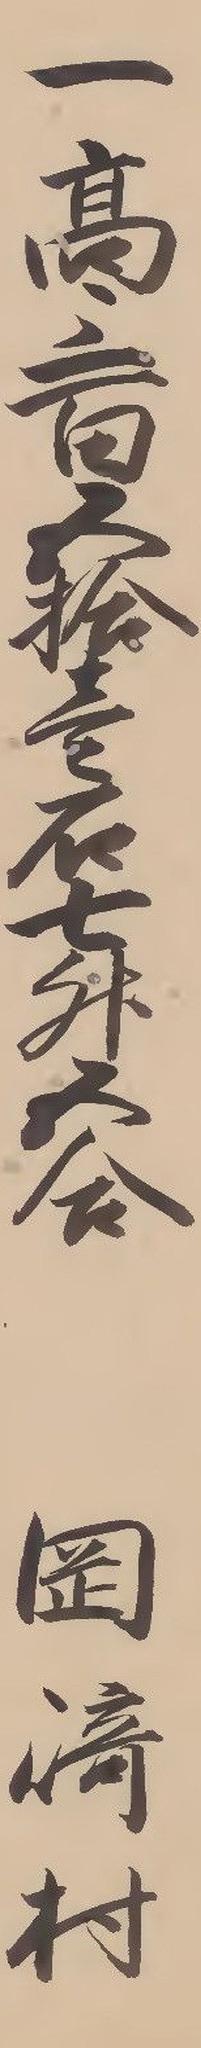一高三百五拾壱石七升五合岡崎村
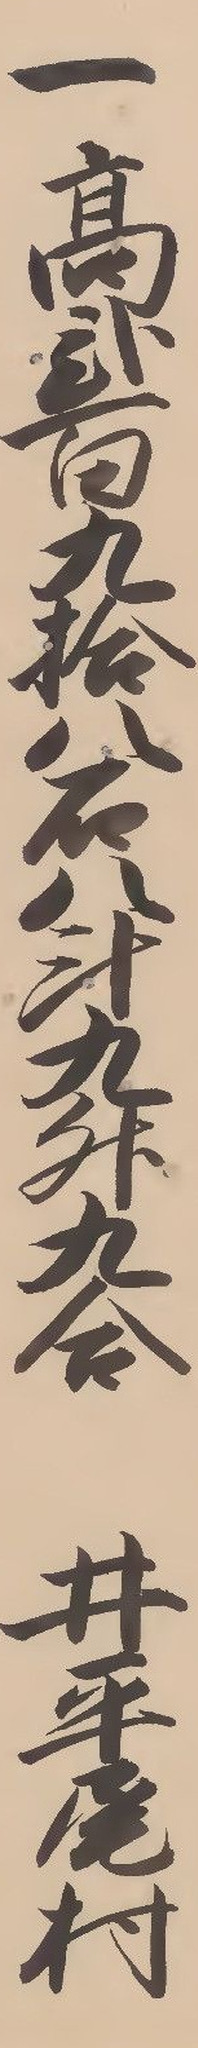一高弐百九拾八石八斗九升九合井平尾村
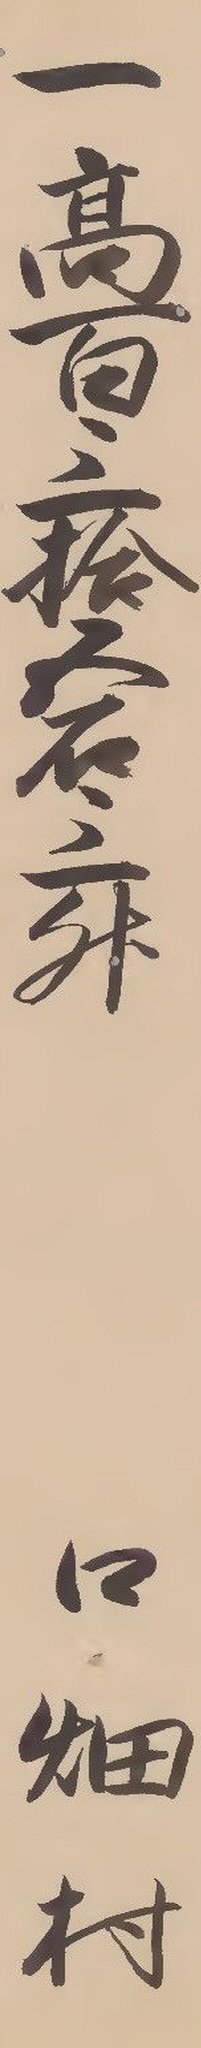一高百三拾五石三升口畑村
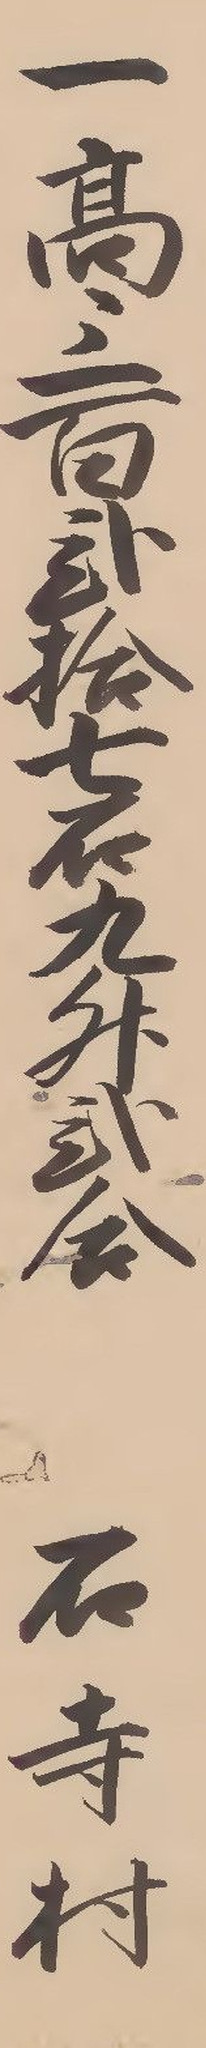一高三百弐拾七石九升弐合石寺村

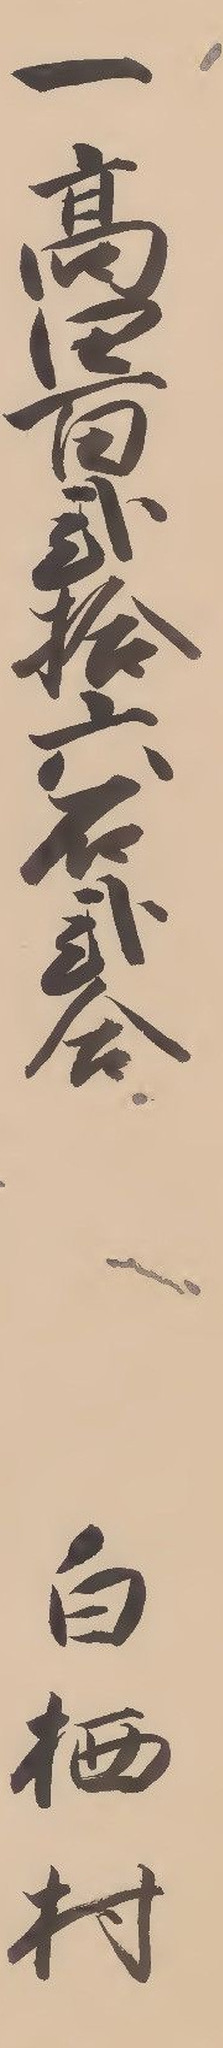一高四百弐拾六石弐合白栖村
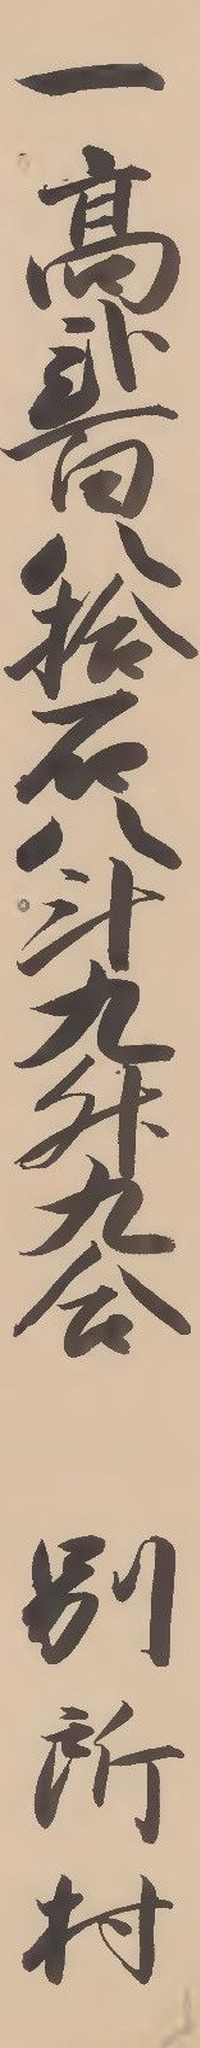一高弐百八拾石八斗九升九合別所村
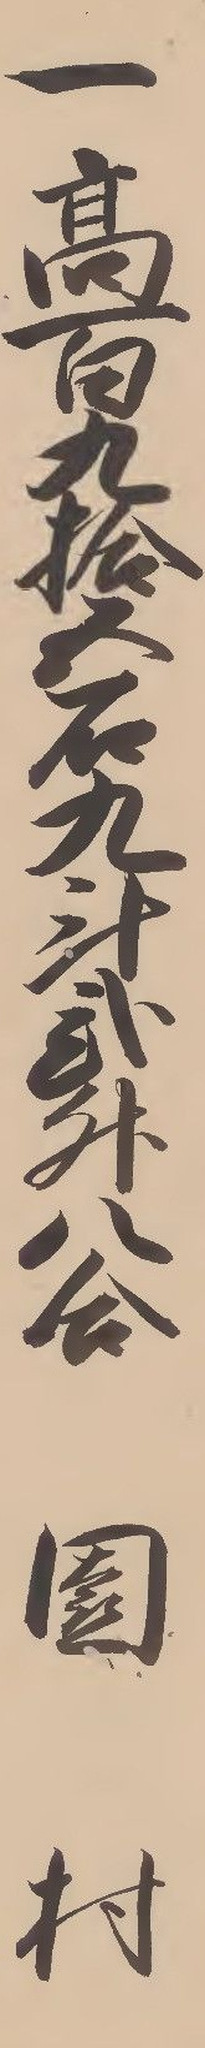一高百九拾五石九斗弐升八合園村
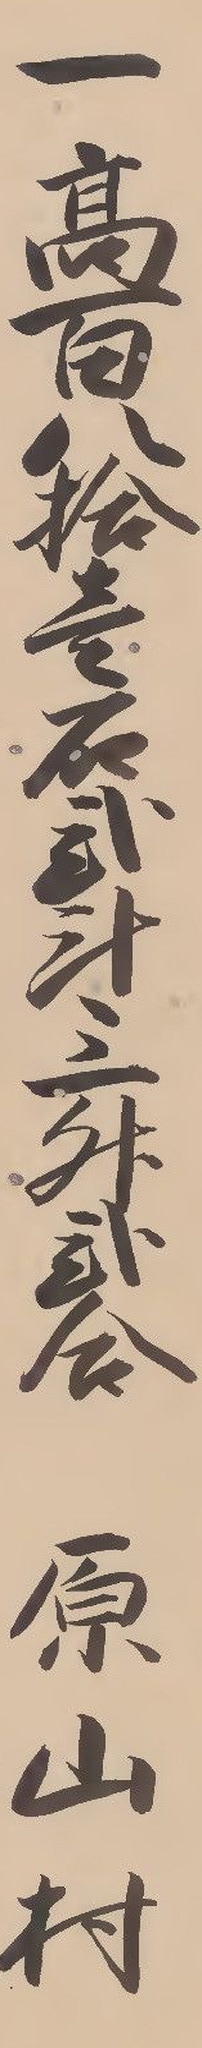一高百八拾壱石弐斗三升弐合原山村
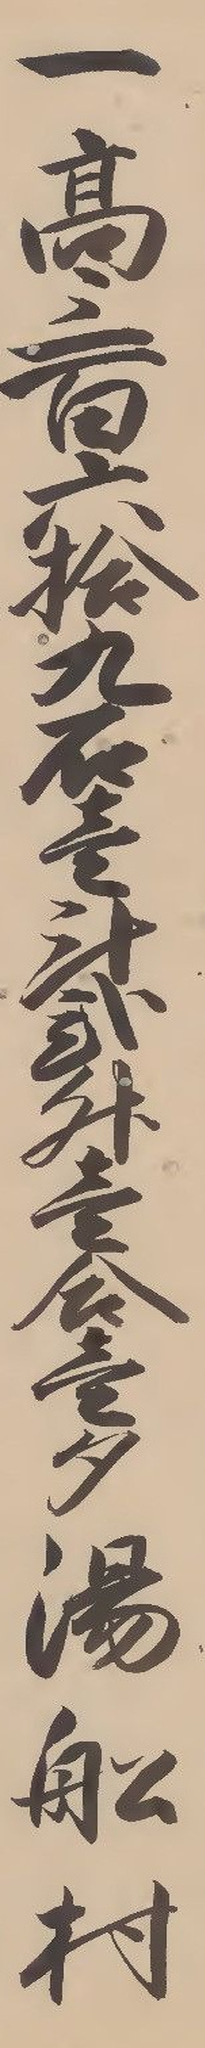一高三百六拾九石壱斗弐升壱合壱勺湯船村
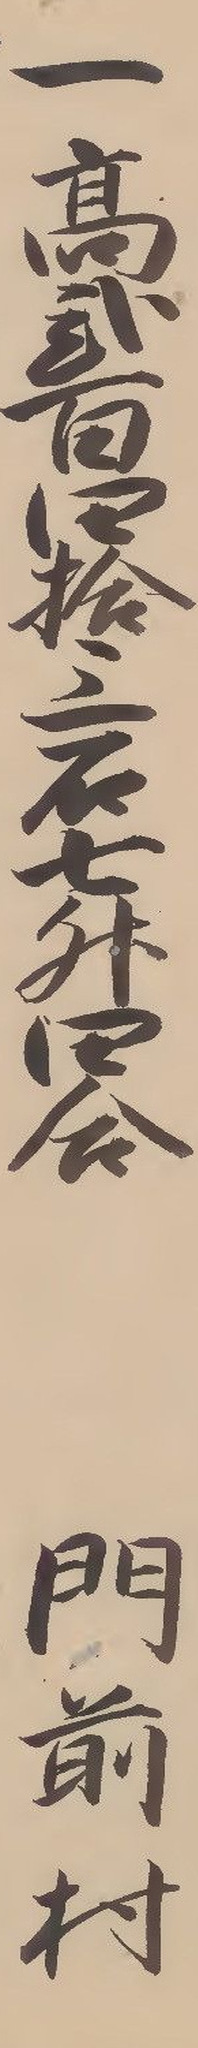一高弐百四拾三石七升四合門前村
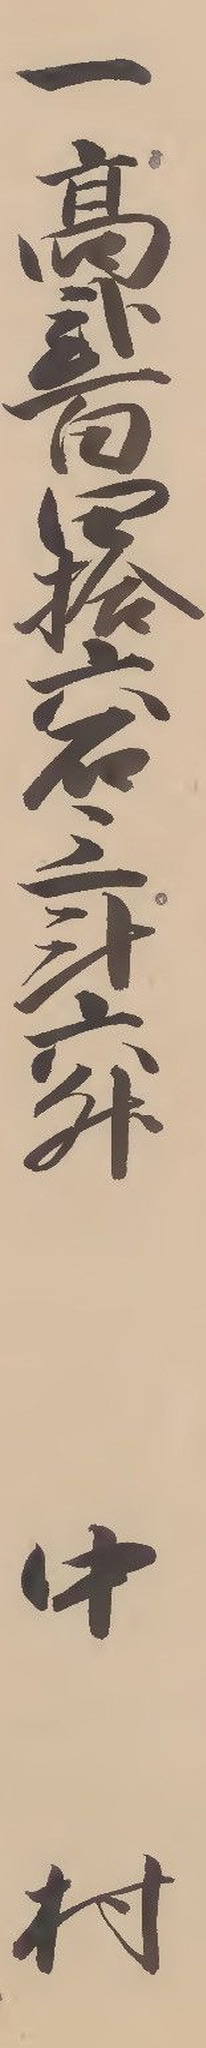一高弐百四拾六石三斗六升中村
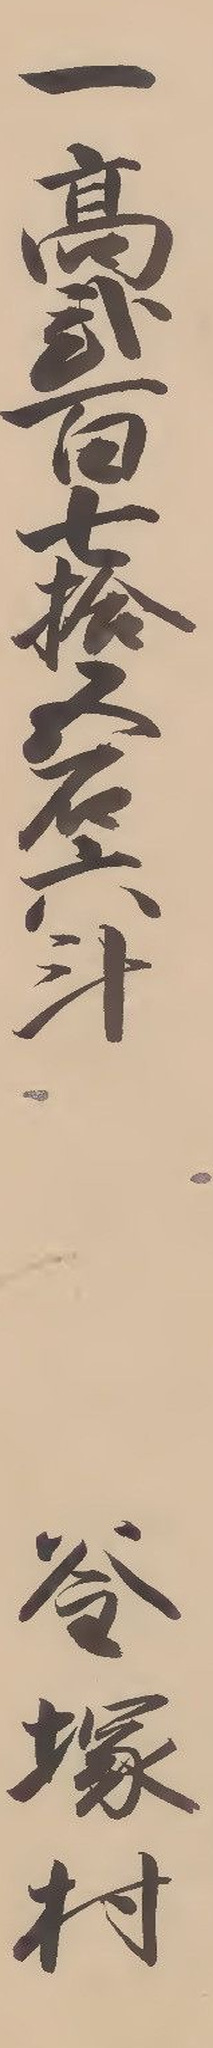一高弐百七拾五石六斗釜塚村
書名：山城国郷帳
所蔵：国立公文書館 National Archives of Japan
